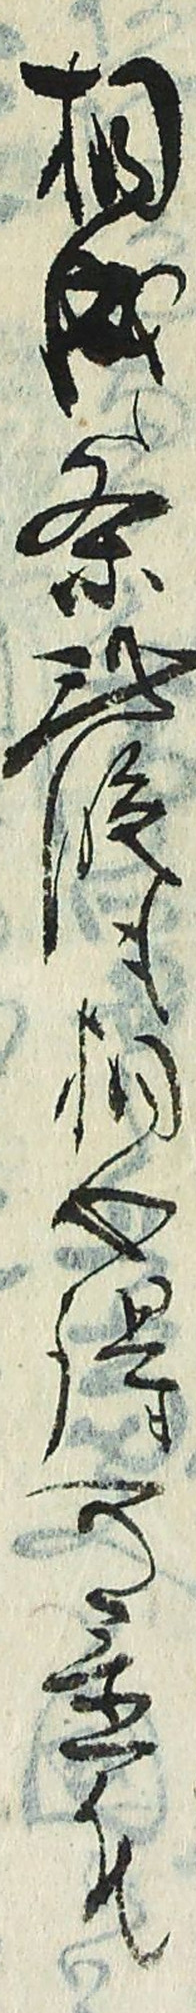相成候条此段も相心得可置候
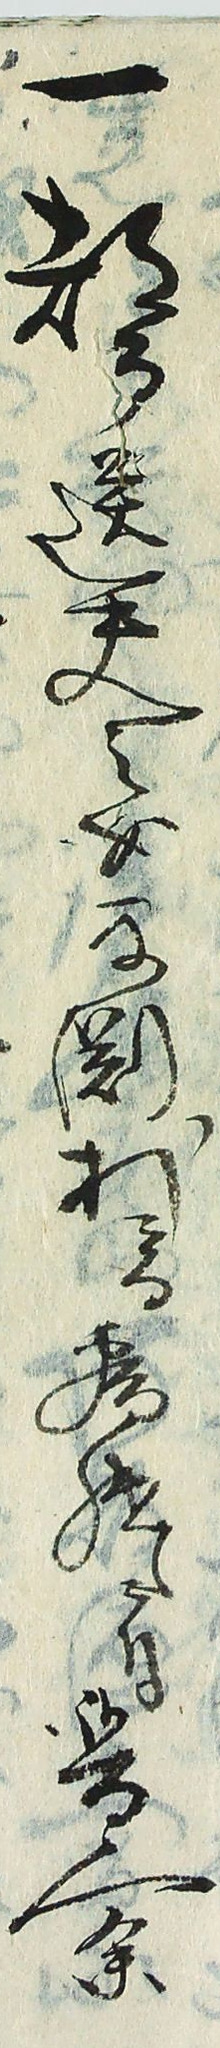一都て送夫之義早淵村にて為継候に付弐百人余
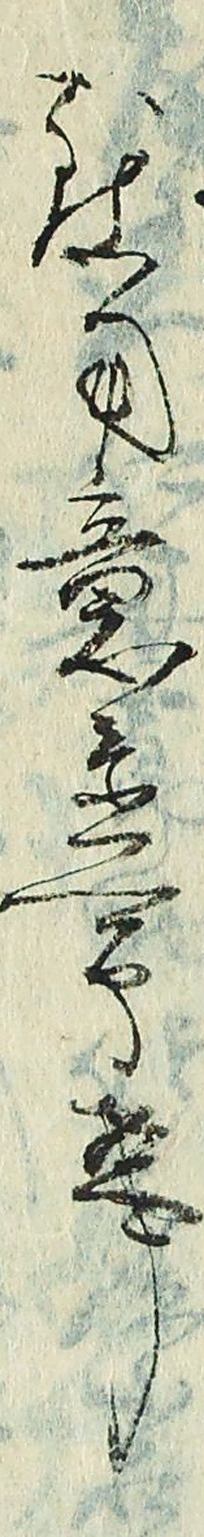座用意置可申事
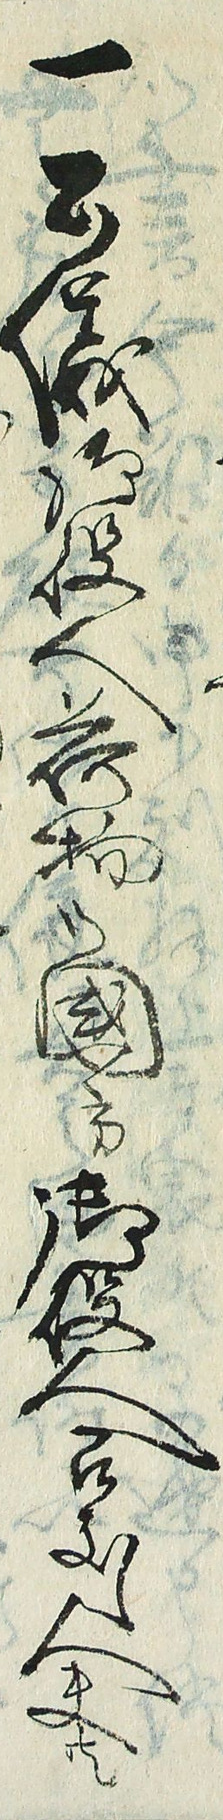一公儀御役人荷物御国方御役人召支之人夫共
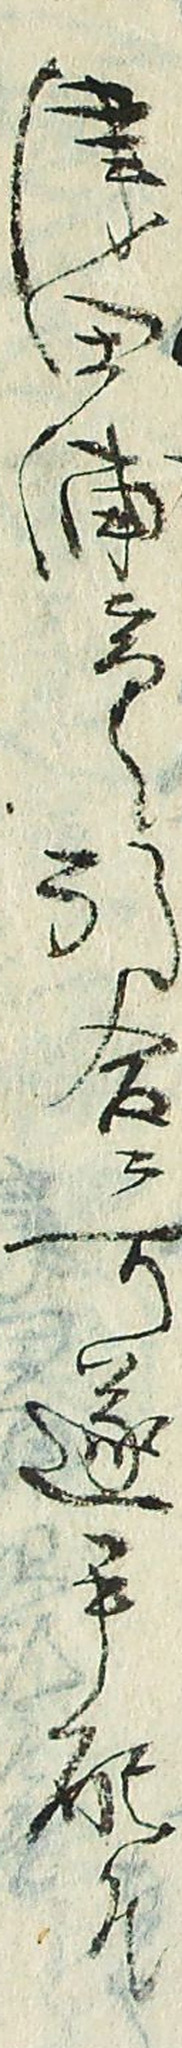津田浦にて之引合に可遂手配候
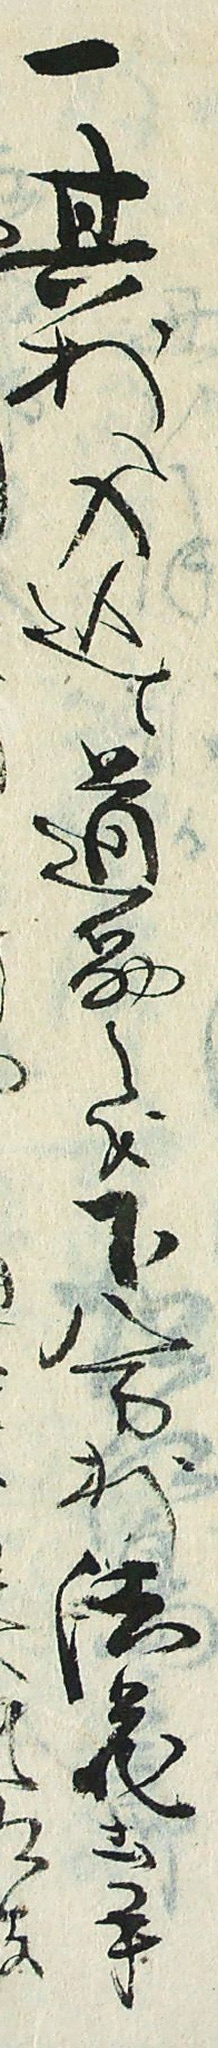一其村へ入込候道筋之義下八万村法花寺
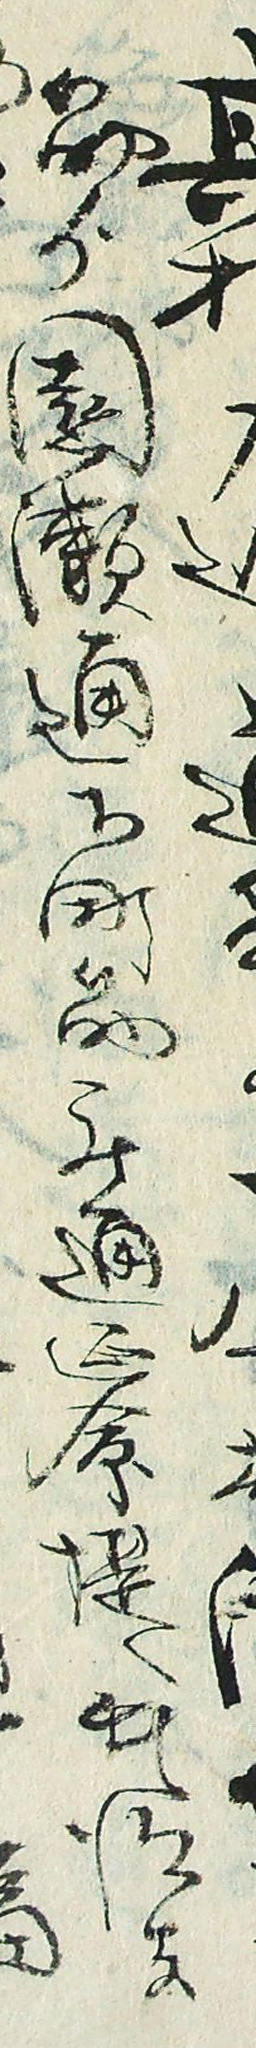筋ゟ園瀬通下町罷通延命堤へ出候得は
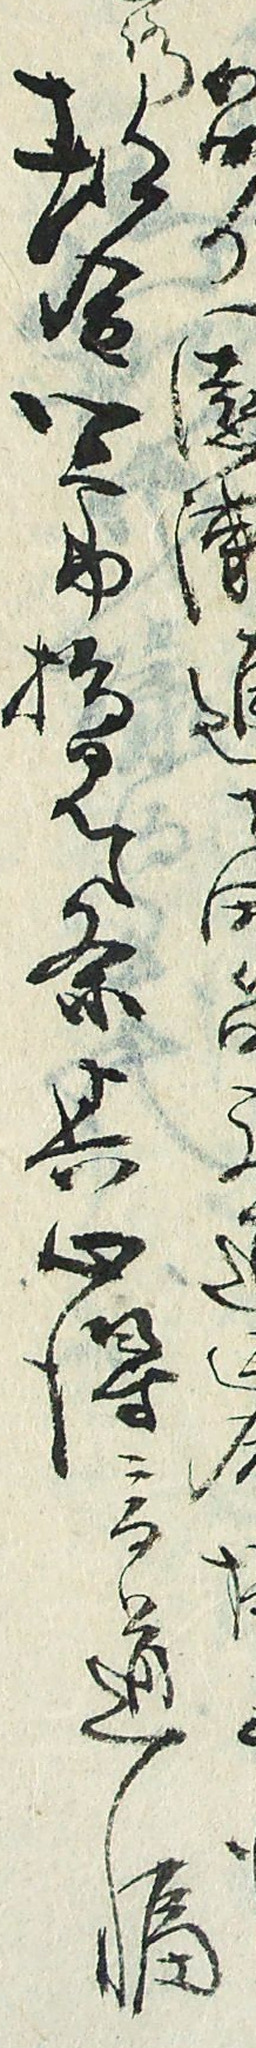都合宜布指見候条其心得にて道幅

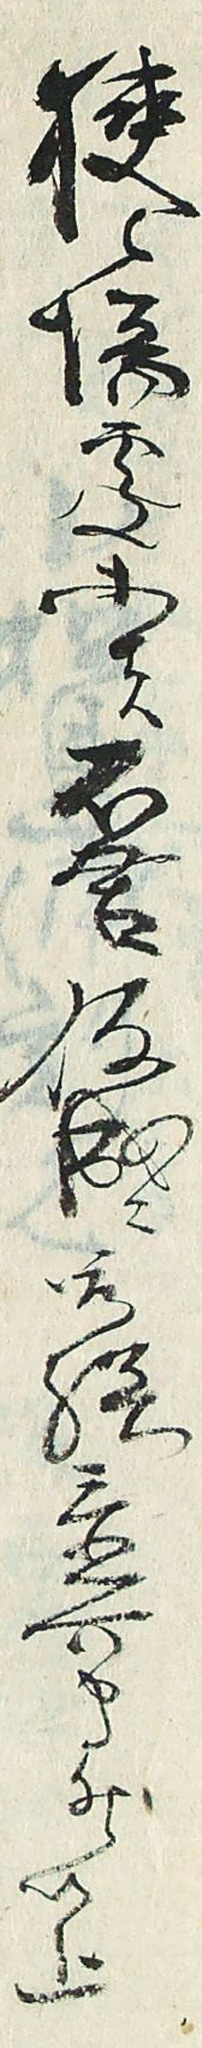狭候場所等は不苦仮成の取繕置可申候以上
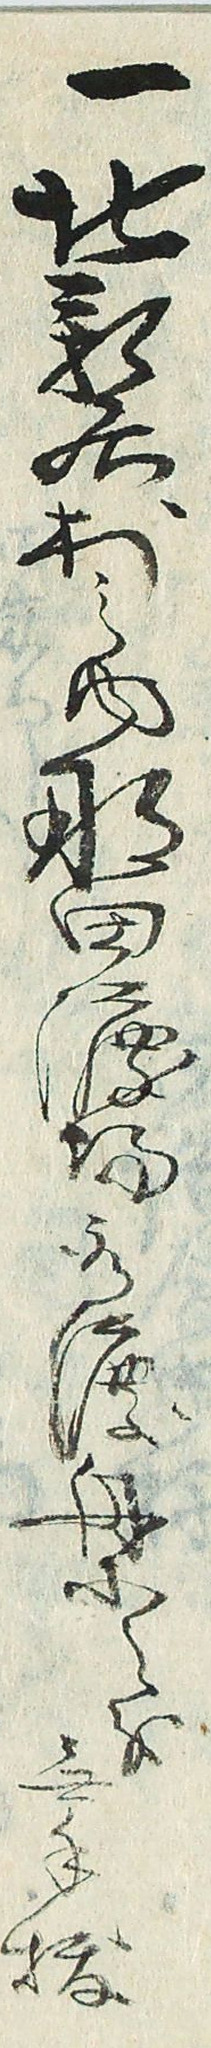一北新居村之内那田渡場取渡舟等之義無手抜
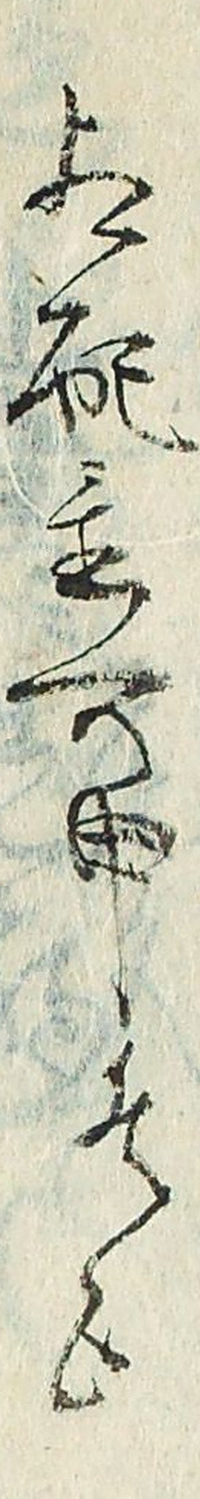相配置可申候以上
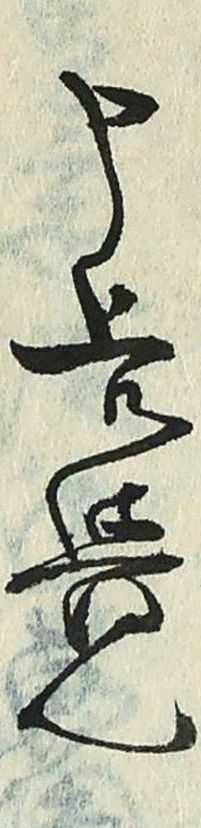申上る覚
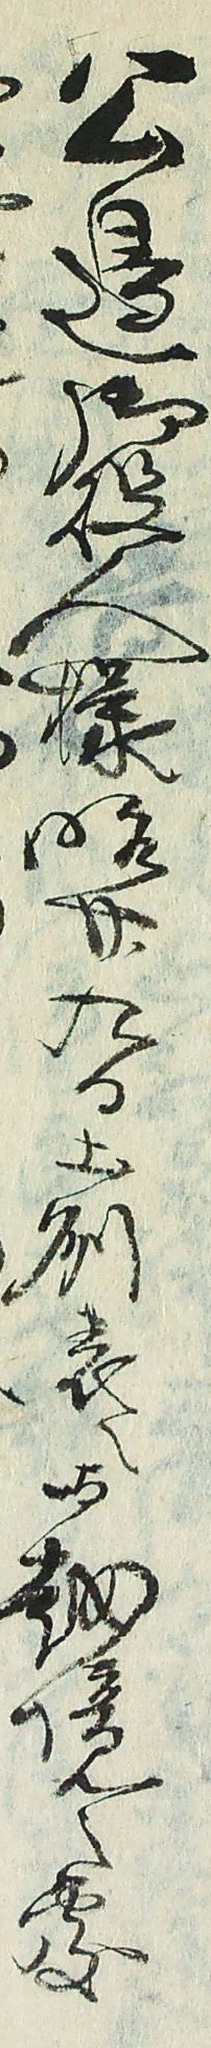公辺御役人様昨廿九日土州表へと越境之処
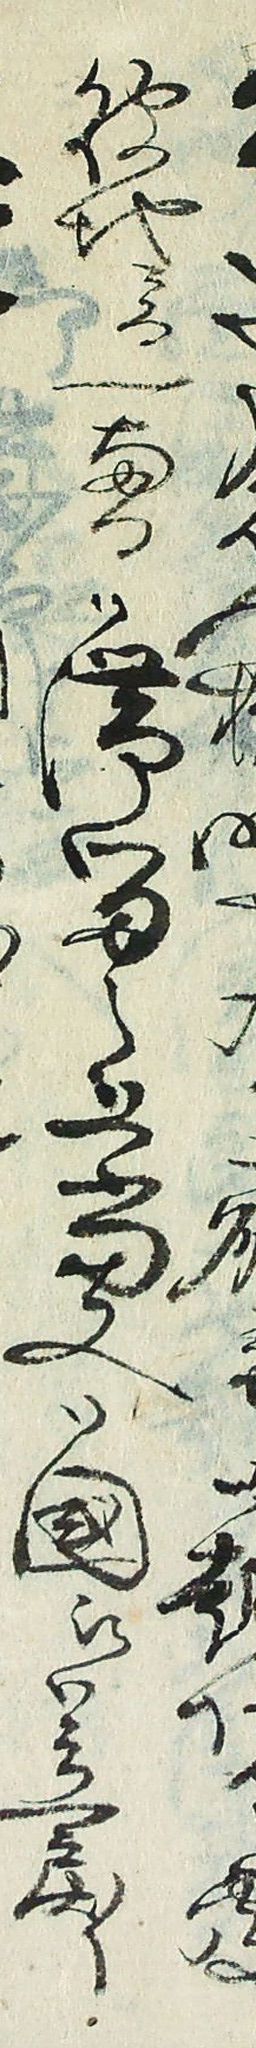彼地にて一両日御滞留之上尚又御国え御立戻り
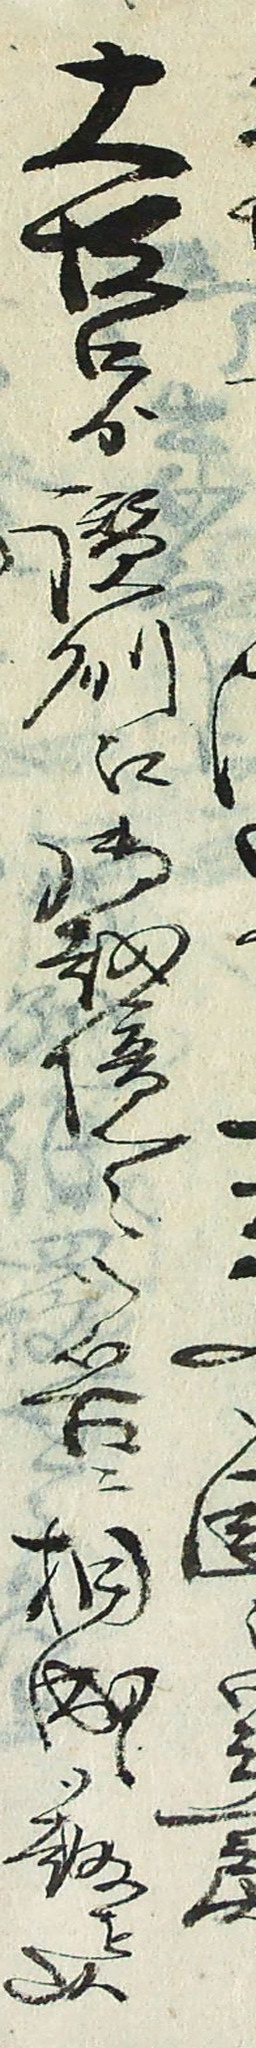大坂口ゟ讃州え御越境之御筈に相成候御趣を以
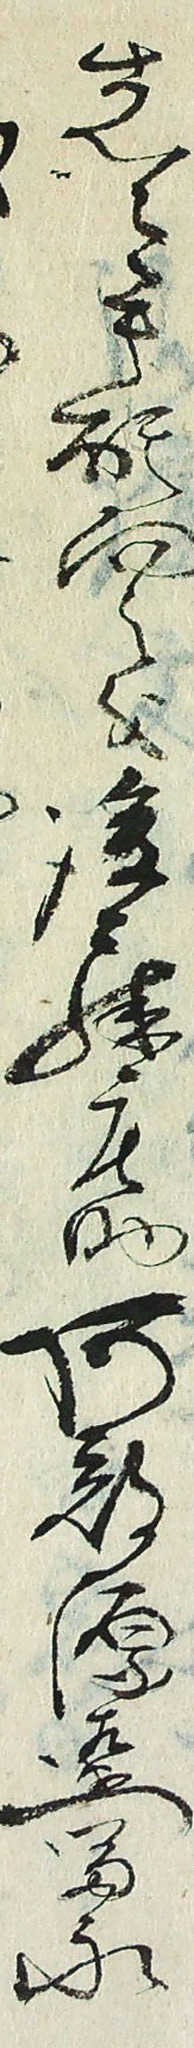先々手配向之義後藤庄助阿部源左衛門富永
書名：公辺御役人為御廻浦御立越諸御用一巻
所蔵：鳴門教育大学 Naruto University of Education
